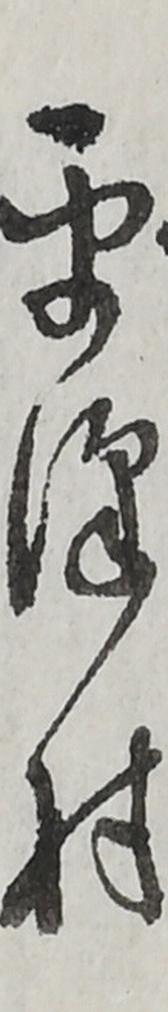平澤村
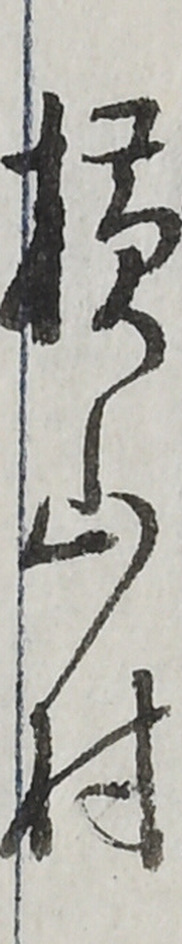横山村
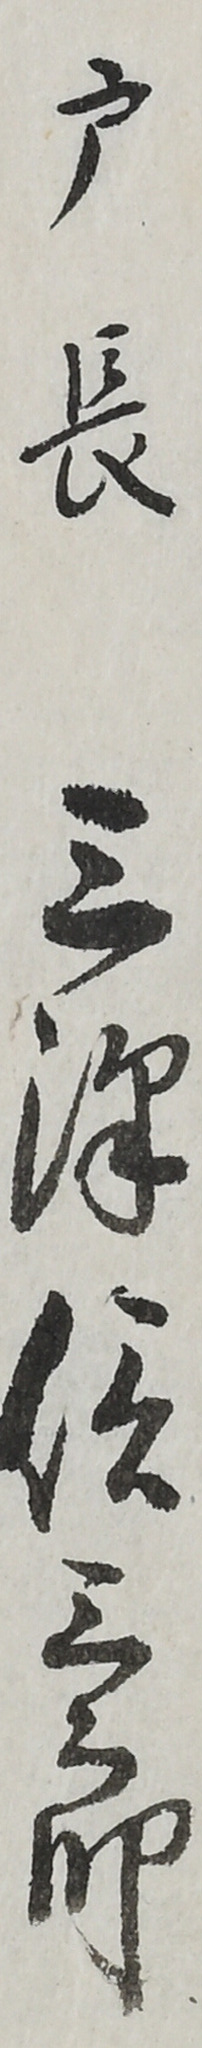戸長三澤信三郎
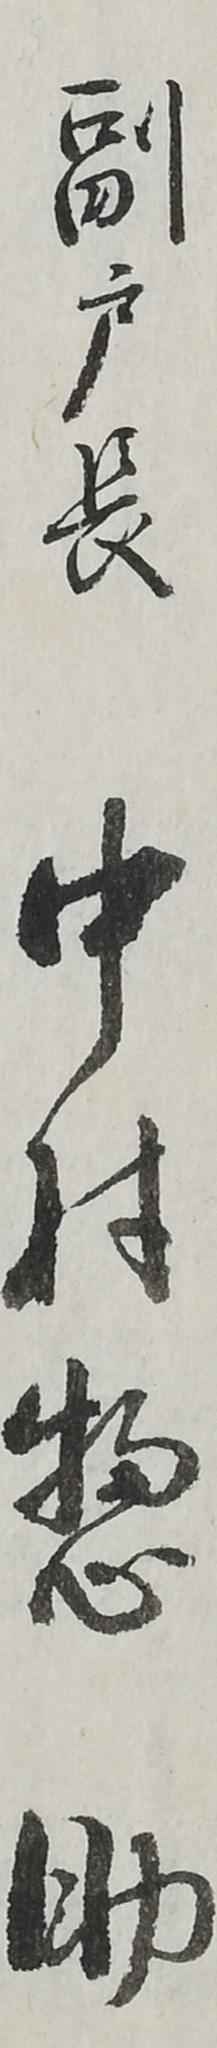副戸長中村惣助
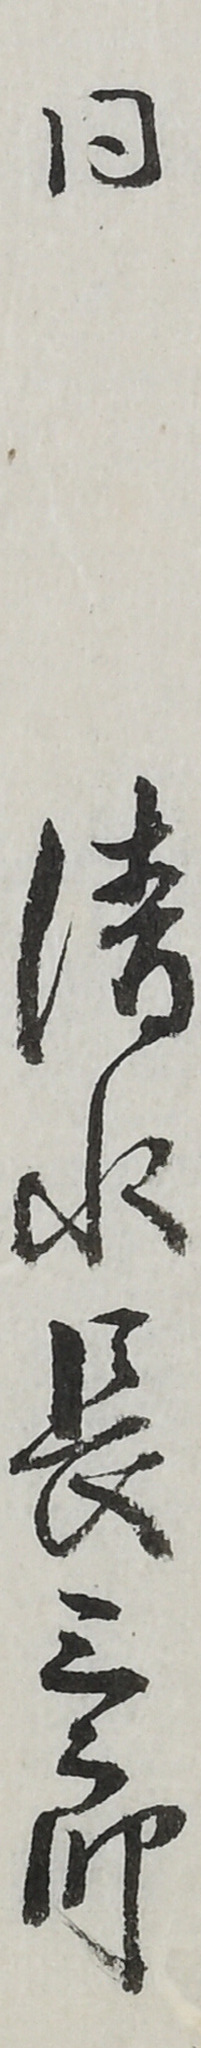同清水長三郎
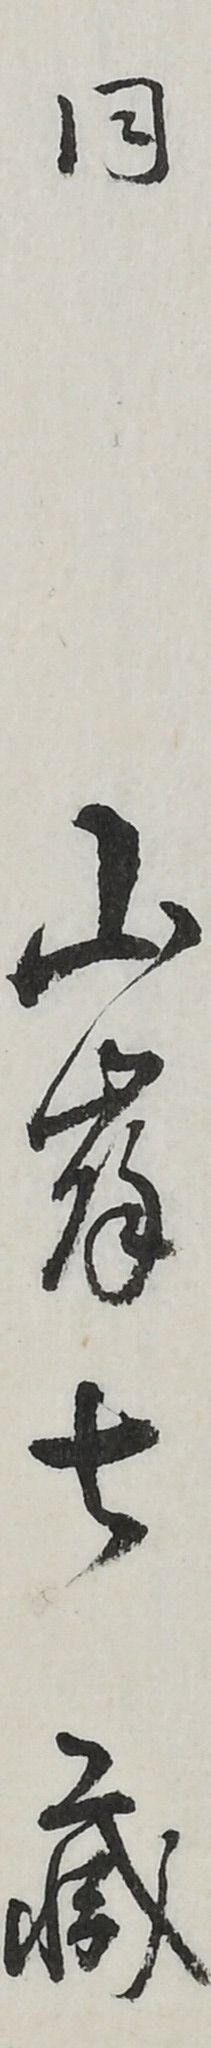同山岸七蔵

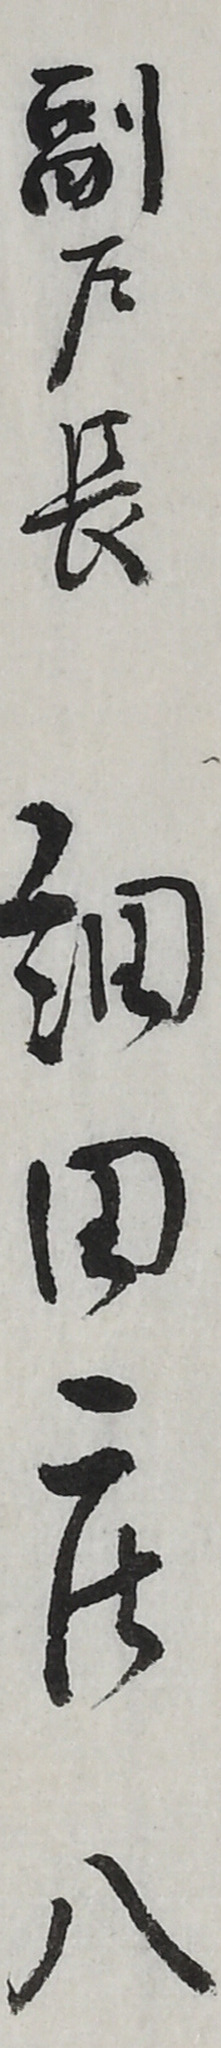副戸長細田庄八
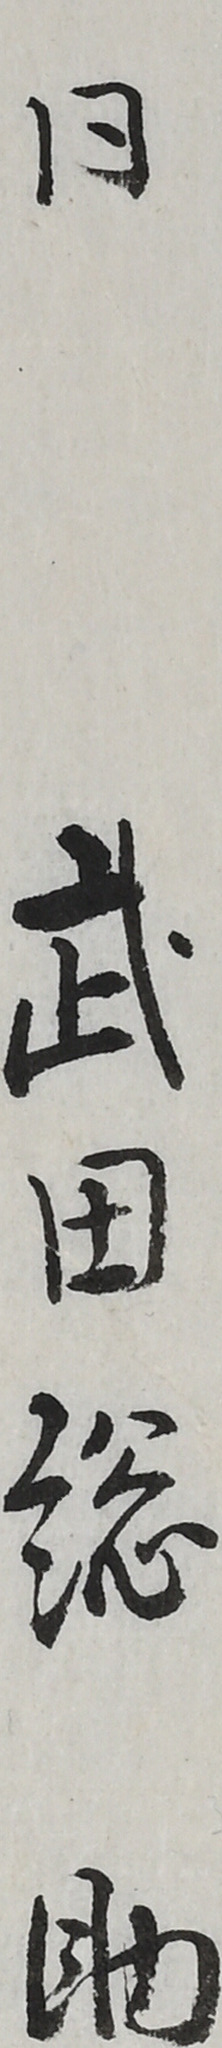同武田総助

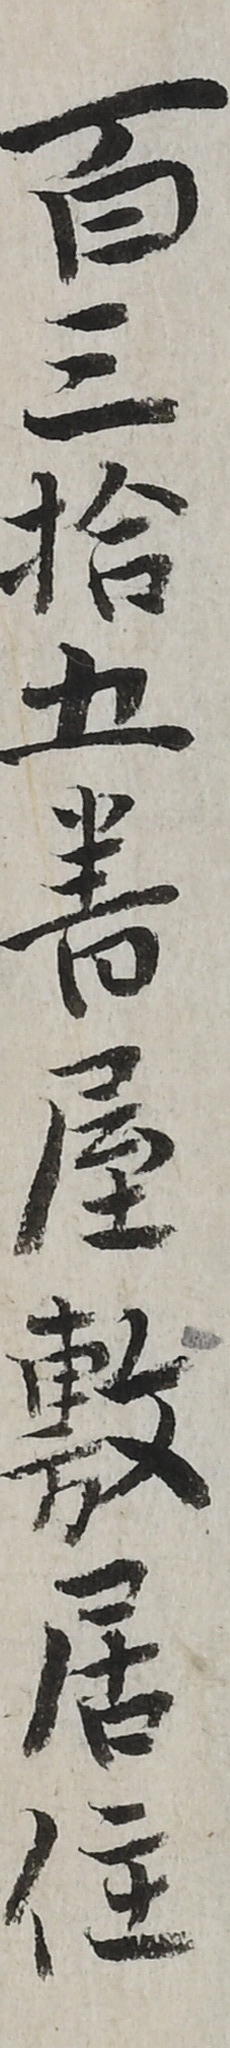百三拾五番屋敷居住
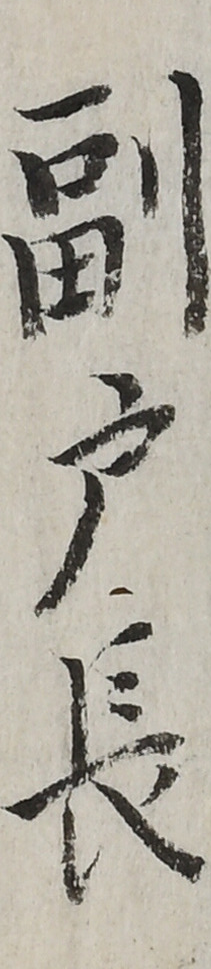副戸長
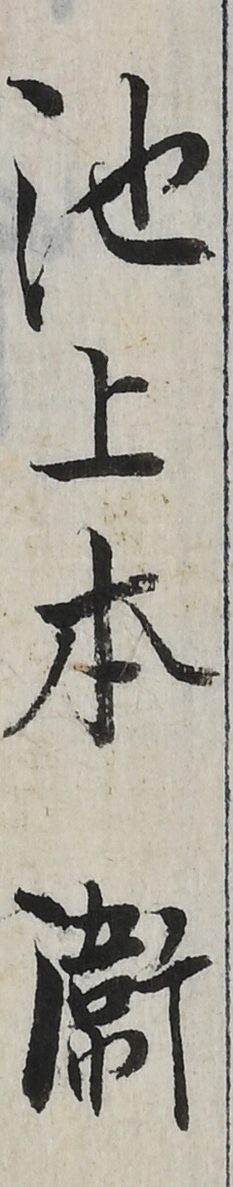池上本衛
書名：伊那郡毎村戸長副戸長名簿
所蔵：伊那市立高遠町図書館・合同会社AMANE
